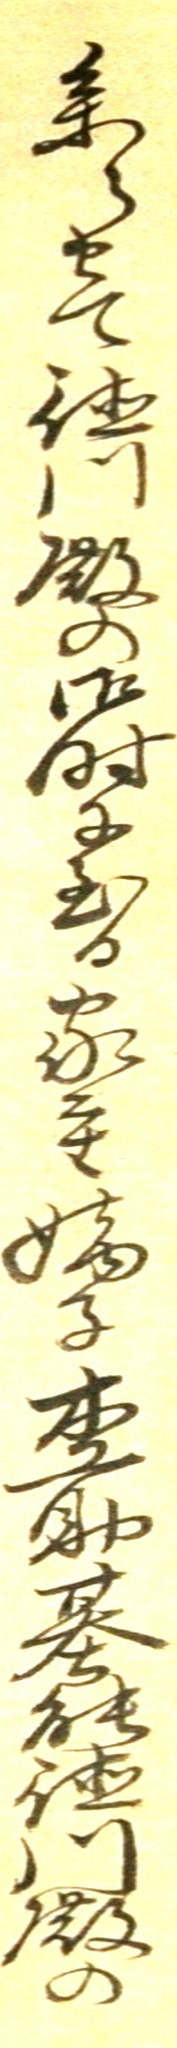参らせて徳川殿の御時に至る家重嫡子木工助基能徳川殿の
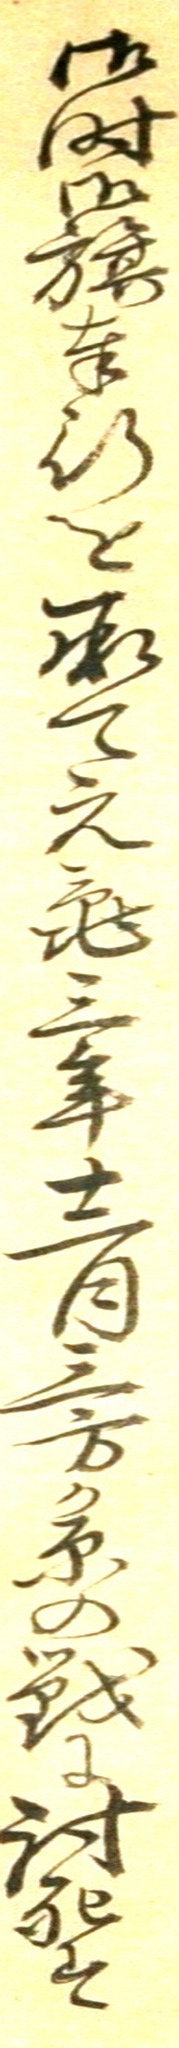御時御旗本奉行を承て元亀三年十二月三方か原の戦に討死す
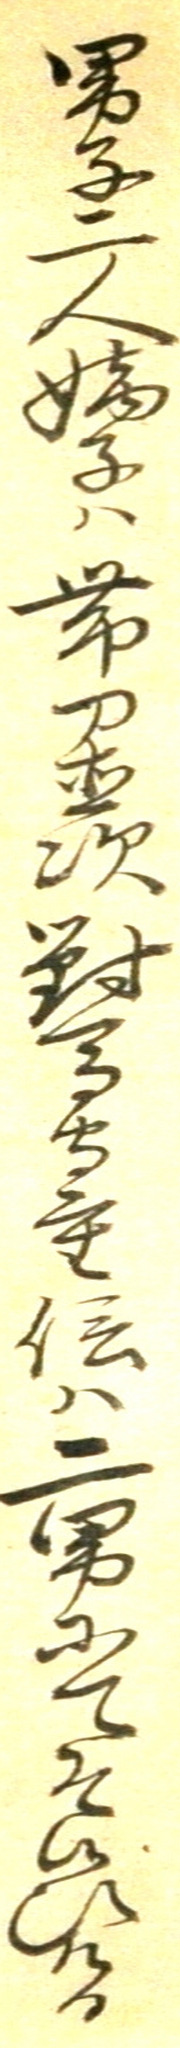男子二人嫡子は帯刀直次対馬守重信は二男にてそ候ひける
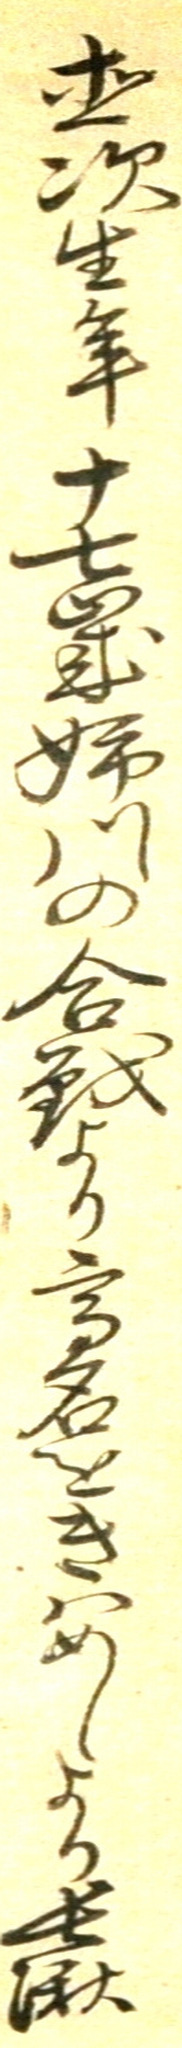直次生年十七歳姉川の合戦より高名をきはめしより長湫
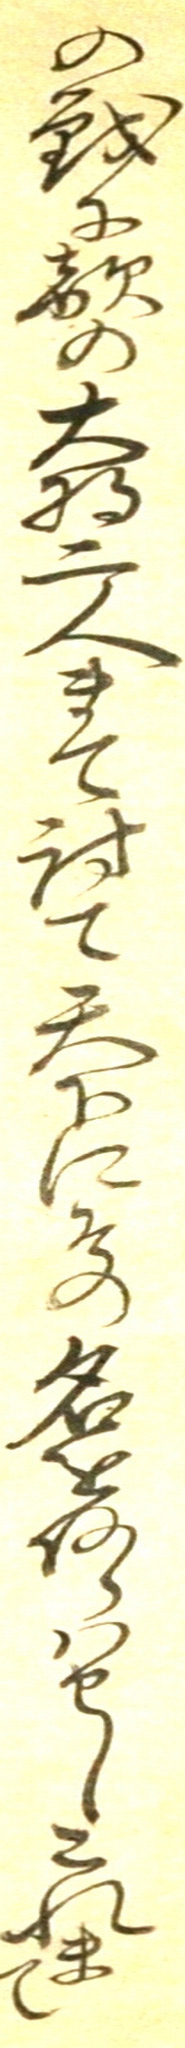の戦に敵の大将二人まて討て天下にその名をあらはせしこれまて
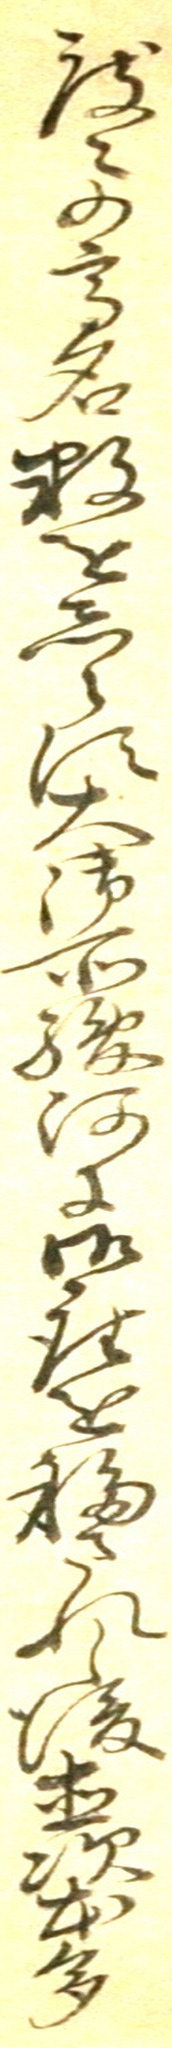度々の高名数をしらす大御所駿河に御座を移されし後直次本多
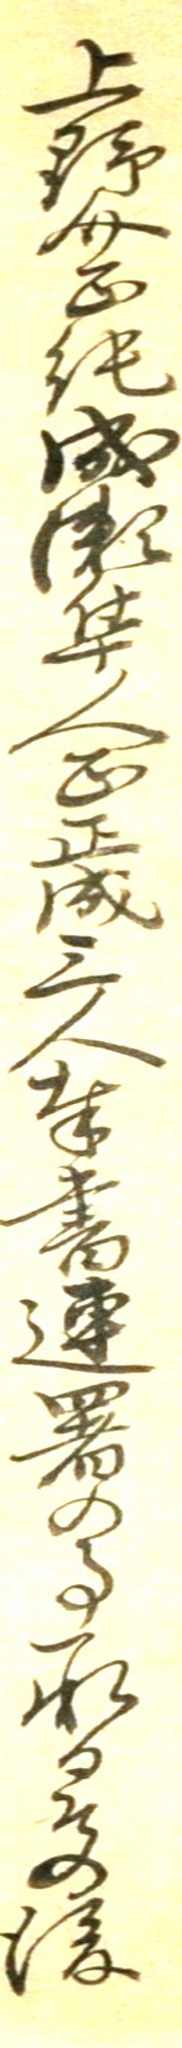上野介正純成瀬隼人正正成三人奉書連署の事承るその後
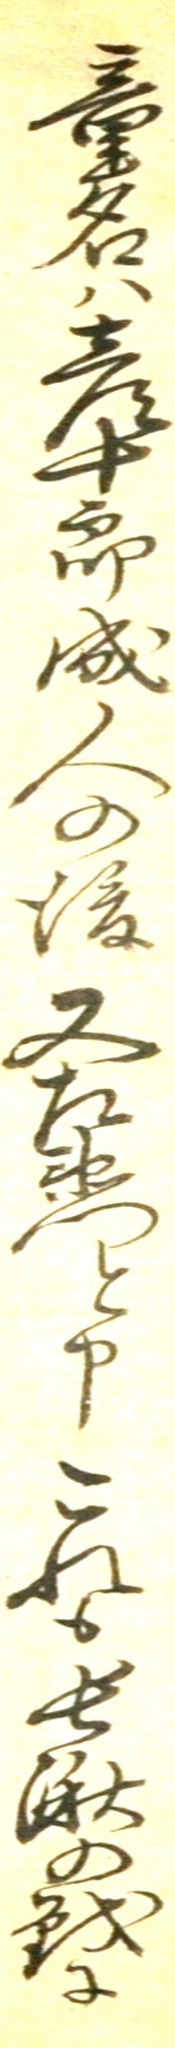童名は彦十郎成人の後又左衛門と申これも長湫の戦に
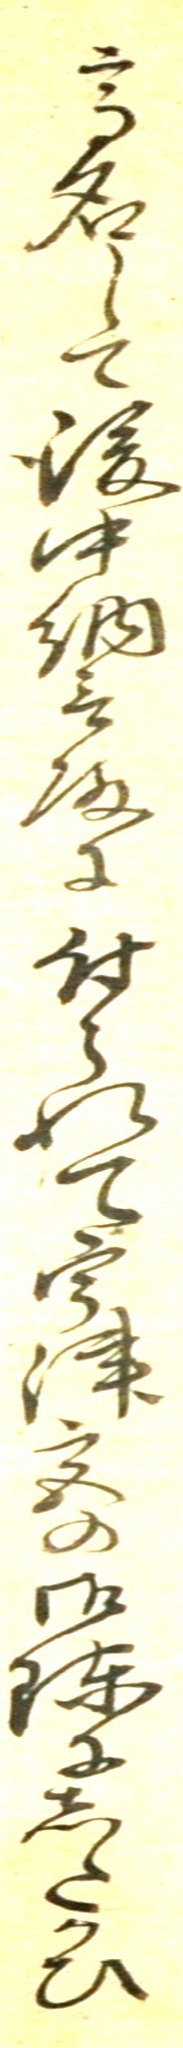高名して後中納言殿に付られて宇津宮の御陣にしたかひ
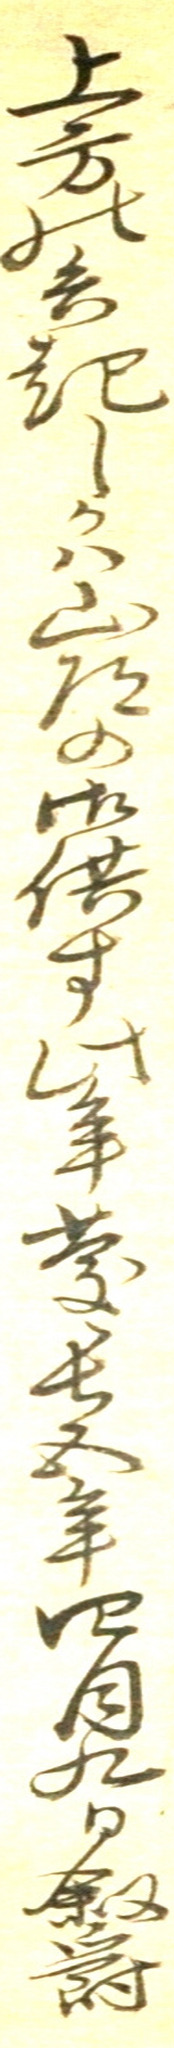上方の兵起しかは山道の御供す此年慶長五年四月九日叙爵
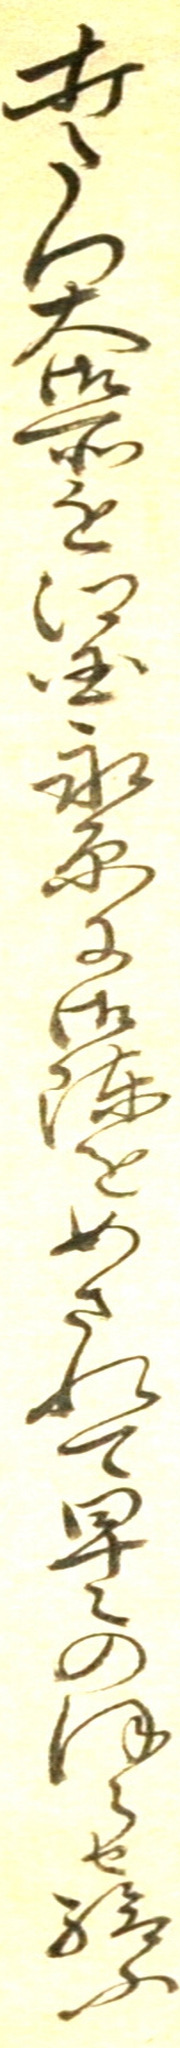打たつ大御所近江国永原に御陣をめされて早々のほらせ給ふ
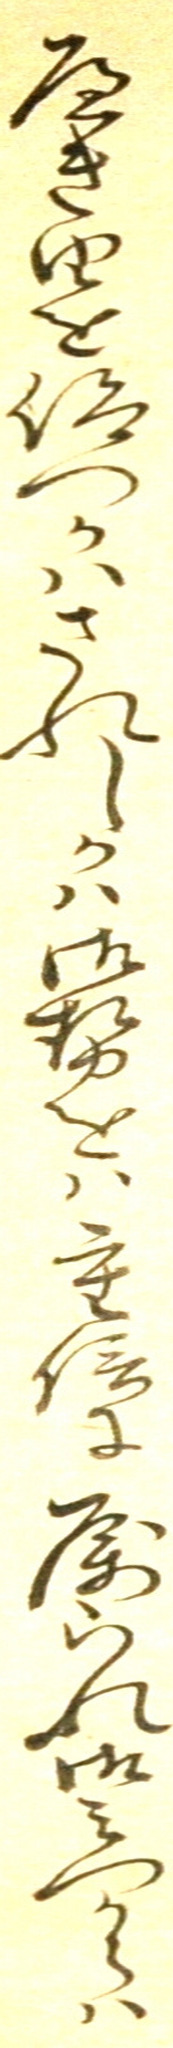へき由を仰つかはされしかは御勢をは重信に属られ御みつからは
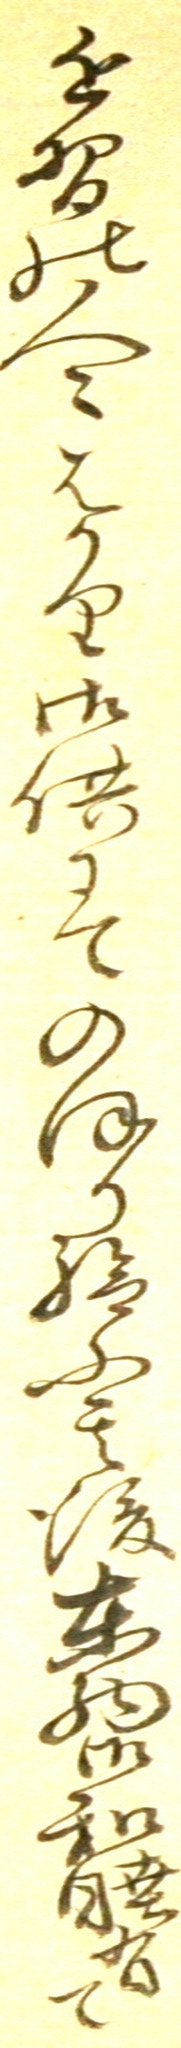近習の人々はかり御供にてのほり給ふ其後東西御和睦有て
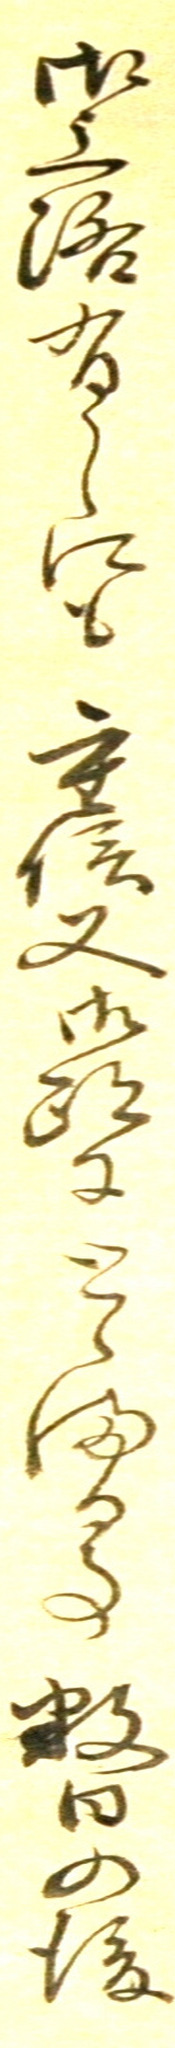御上洛有しにも重信又御跡にとゝまる事数日の後

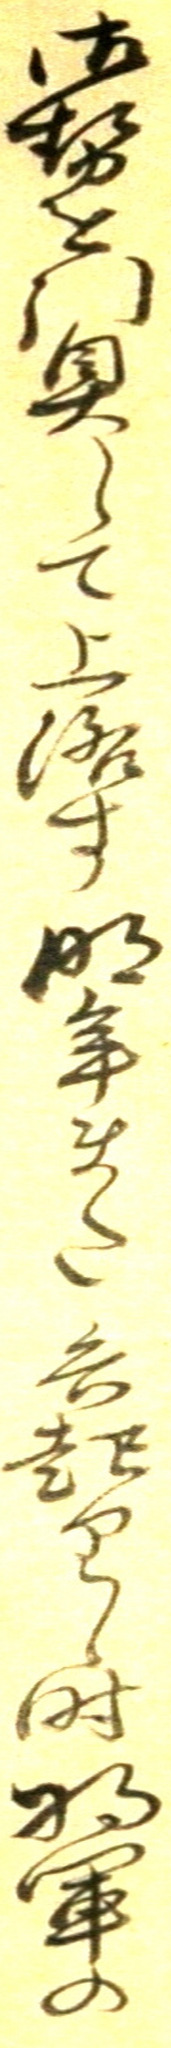御勢を引具して上洛す明年また兵起りし時将軍の
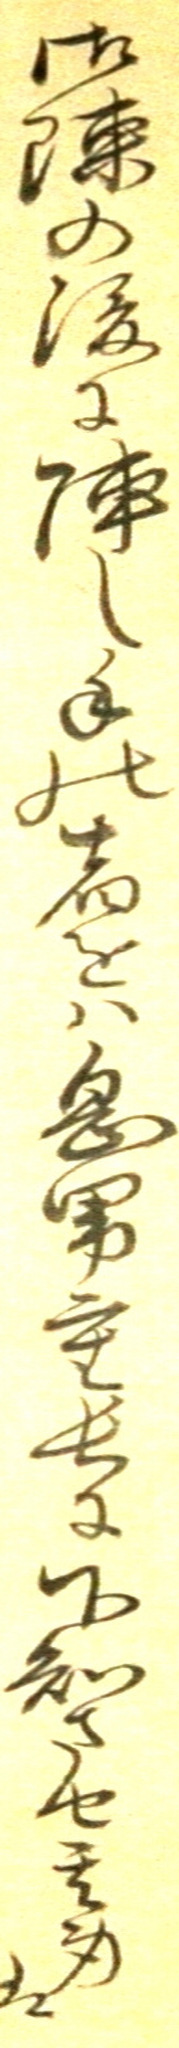御陣の後に陣し手の者をは息男重長に下知させ其身は
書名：藩翰譜（五）
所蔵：伊那市立高遠町図書館・合同会社AMANE
